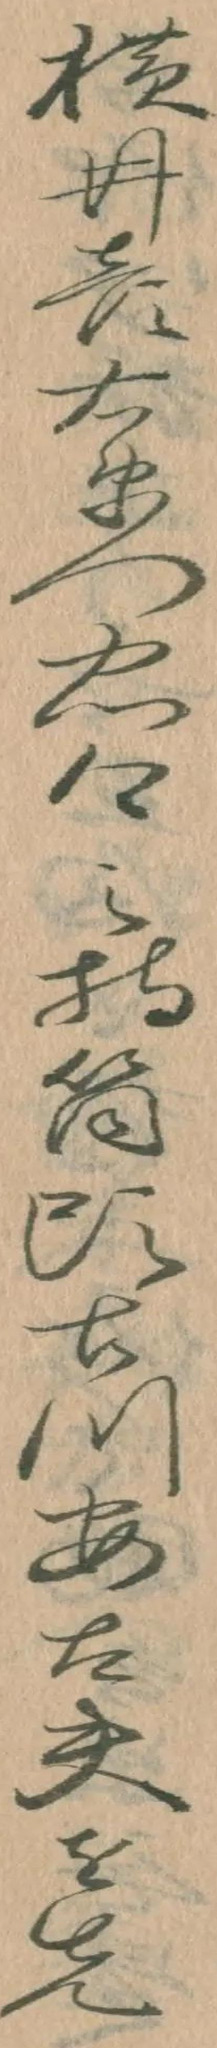横井彦右衛門忠郷之持筒頭古川安太夫を先
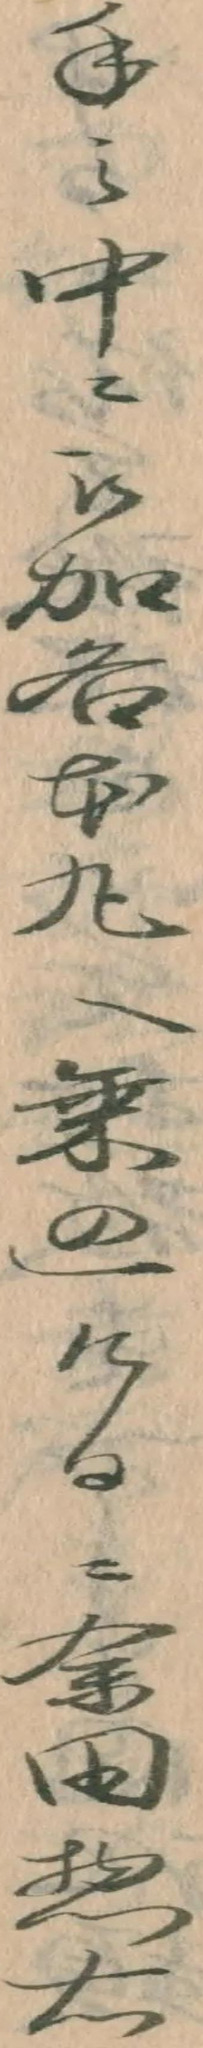手之中に被加各本丸へ乗込けるに余田惣右
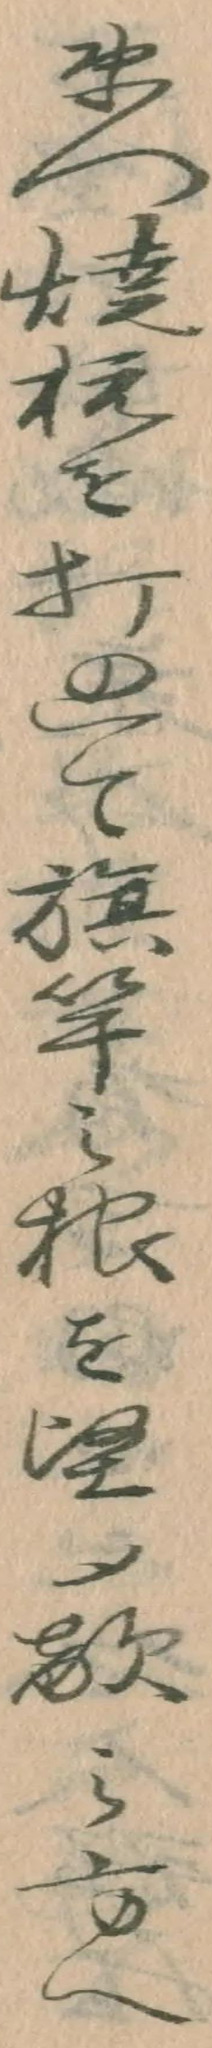衛門焼杭を打込て旗竿之根を堅め敵之方へ
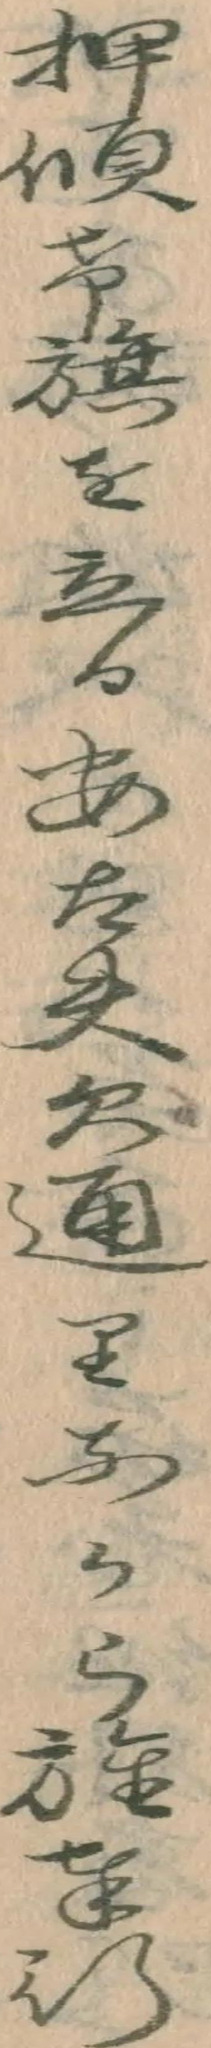押傾希旗を立る安太夫欠通里なから旗奉行
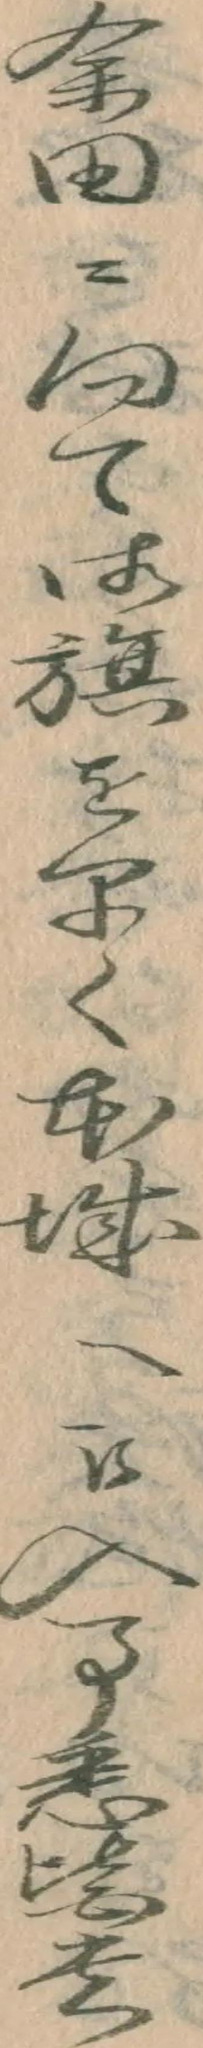余田に向て御旗を早く本城へ被入事悉皆貴
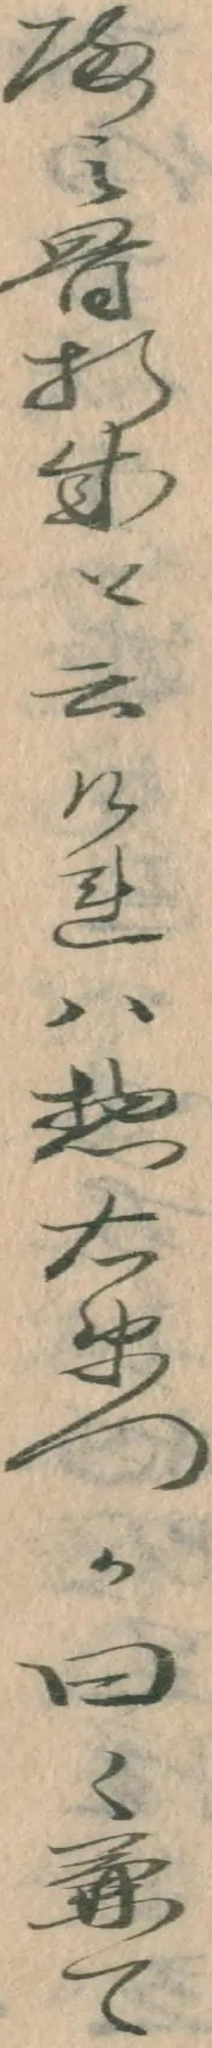殿之骨打成と云け連は惣右衛門か曰く兼て
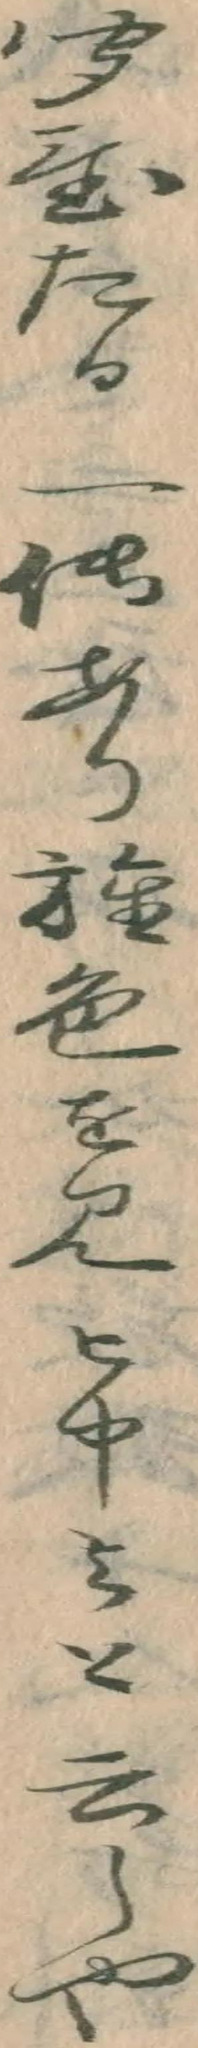聞置たる一伝あり旗色を見被申与と云し也
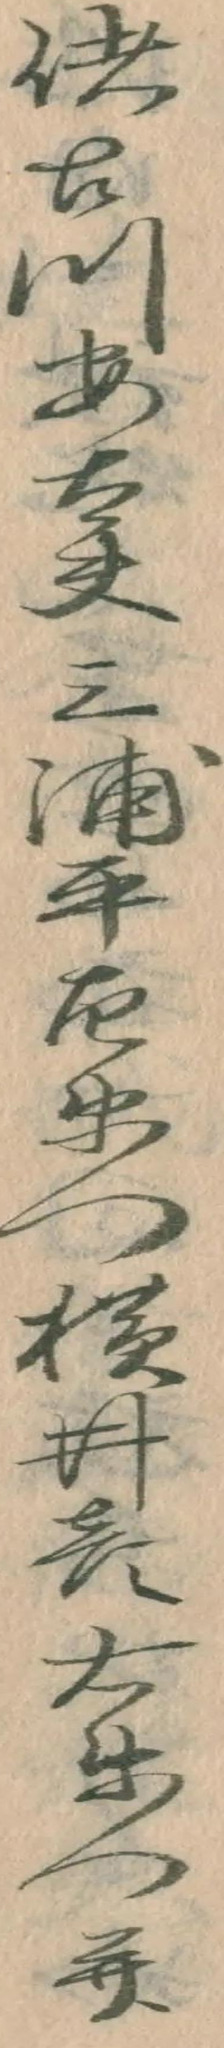偖古川安太夫三浦平左衛門横井彦右衛門幷
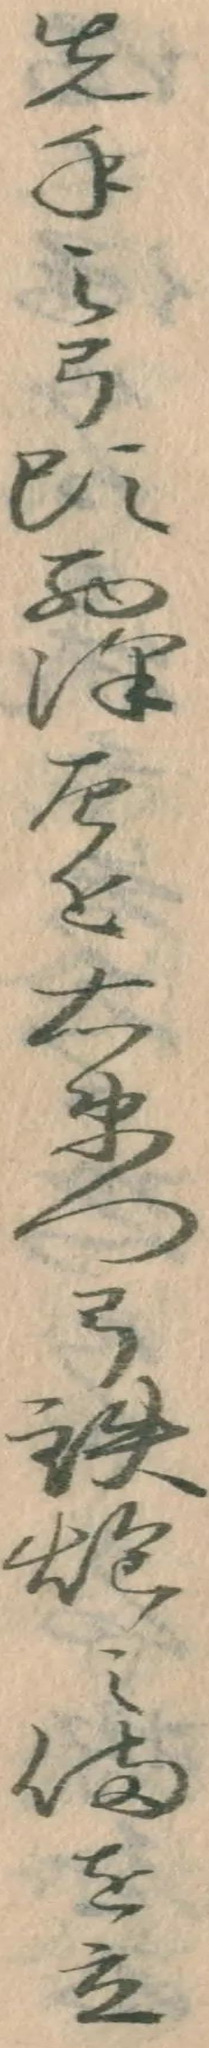先手之弓頭西沢左近右衛門弓鉄炮之備を立
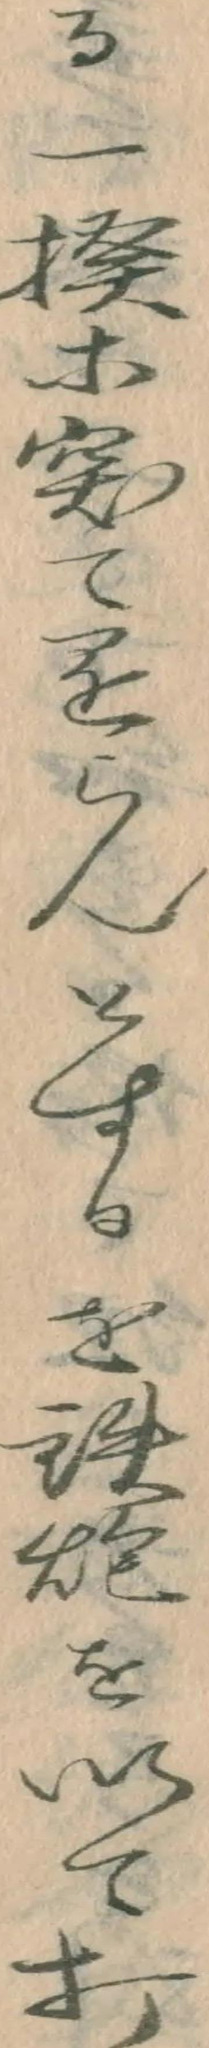る一揆等突て懸らんとするを鉄砲を以て打
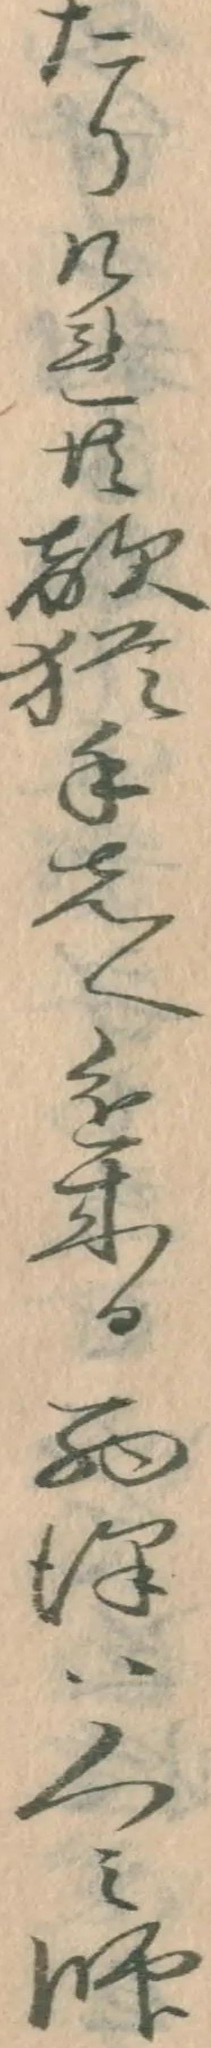たりけ連共敵猶手先へ進来る西沢は人之師

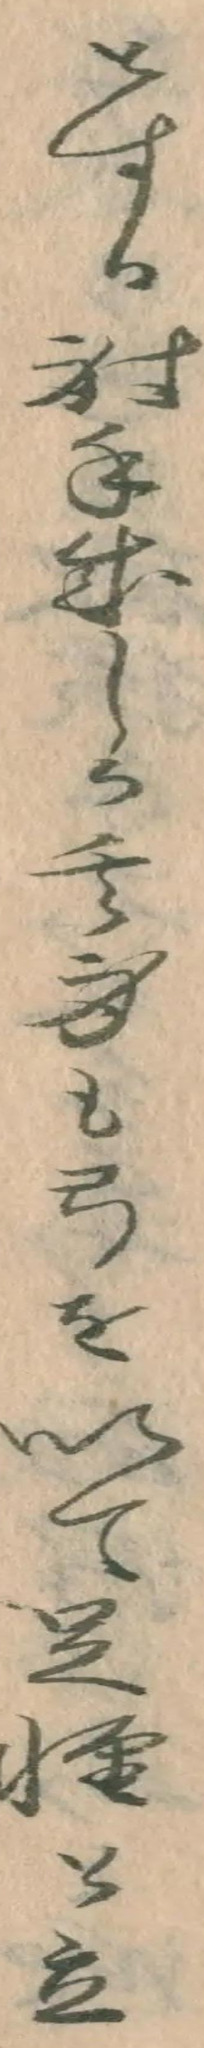とする射手成しか其身も弓を以て足軽と立
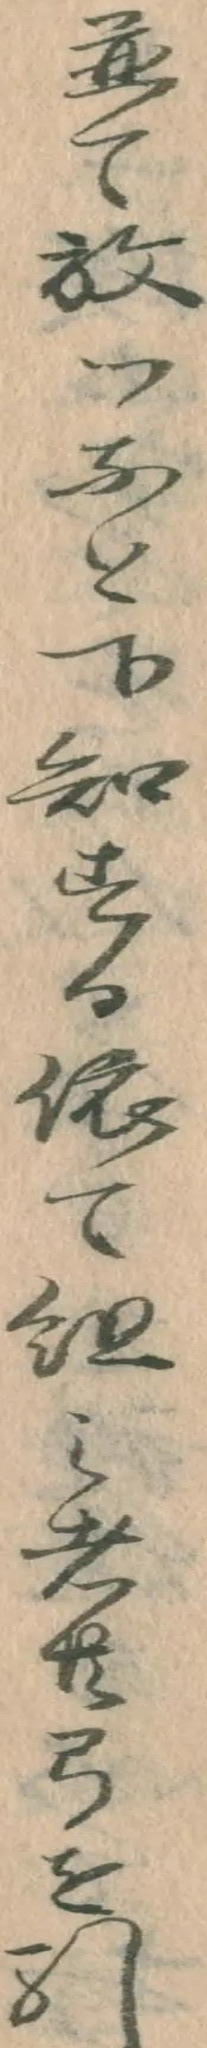並て放つなと下知春る依て組之者共弓を引
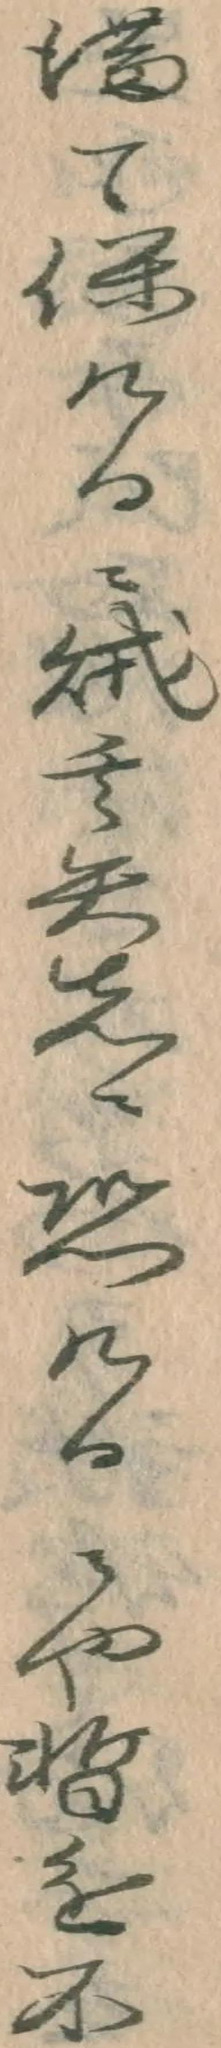満て保けるに賊其矢先に恐けるに也暫進不
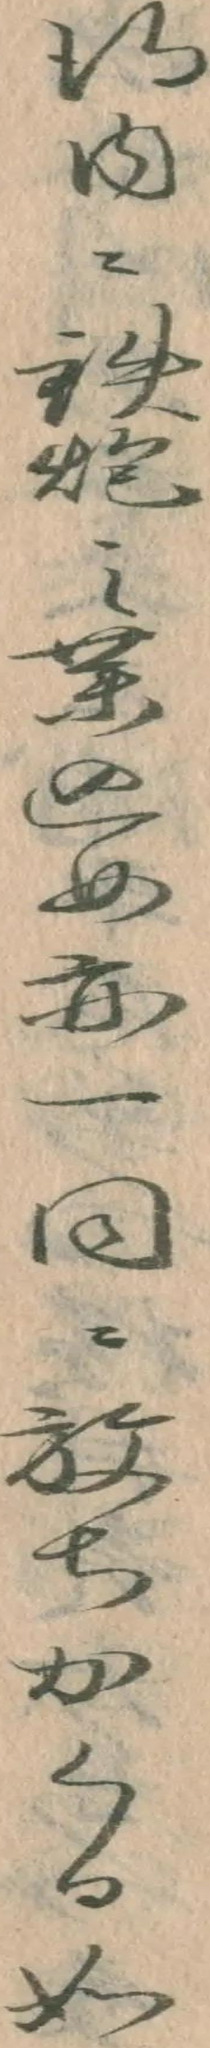得内に鉄砲之薬込め亦一同に放ちかくる如
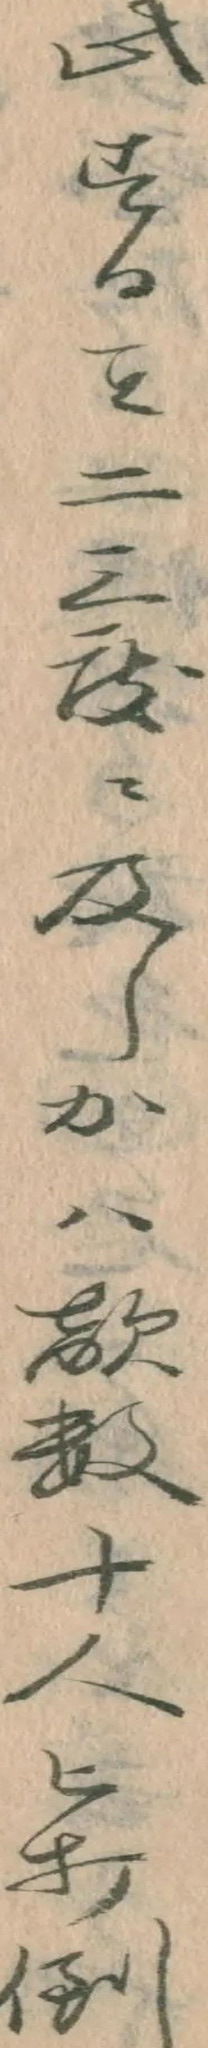此春るを二三度に及しかは敵数十人被打倒
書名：切支丹御退治記 49巻. [9]
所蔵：国立国会図書館 National Diet Library, JAPAN
